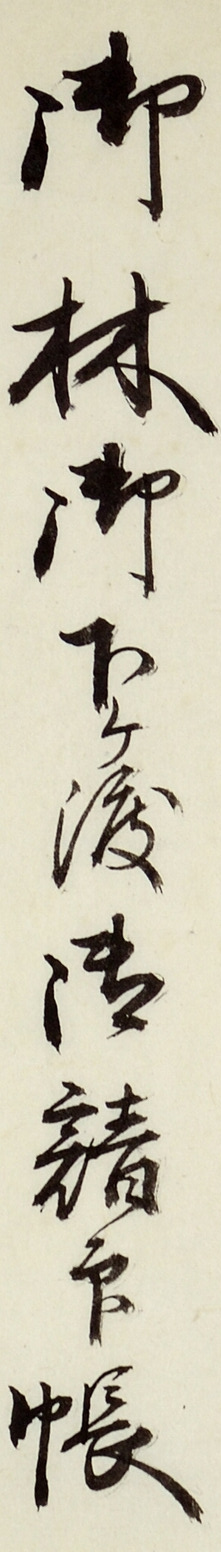御林御下ケ渡御請印帳

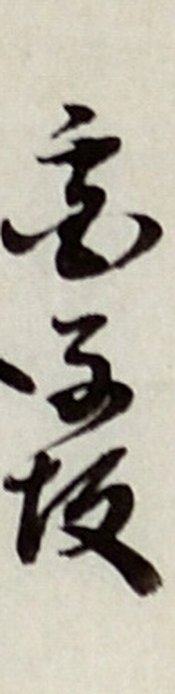団子坂
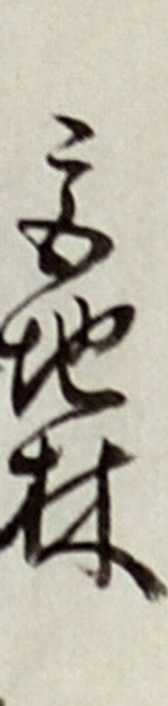宮地林
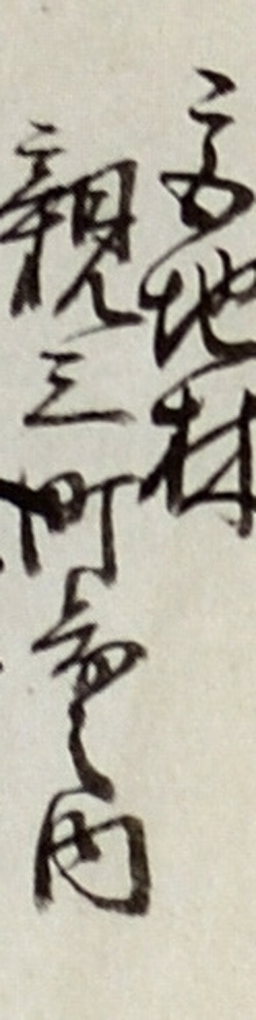親三町歩之内
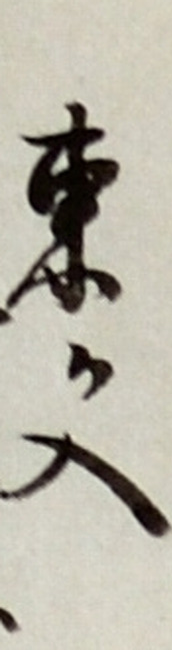東ケ入
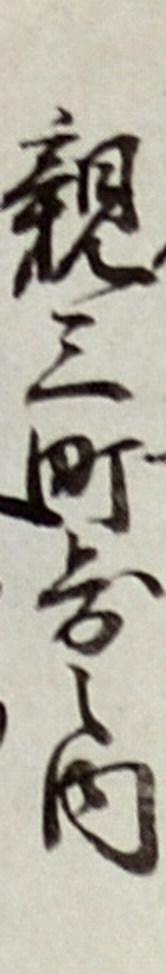親三町歩之内
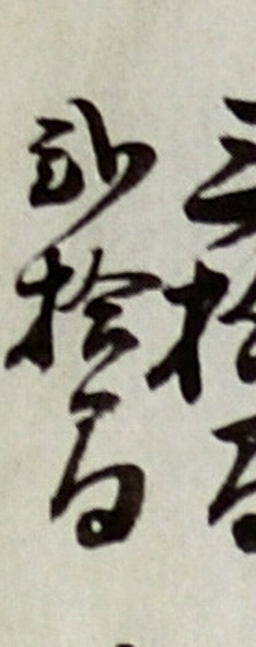弐拾間

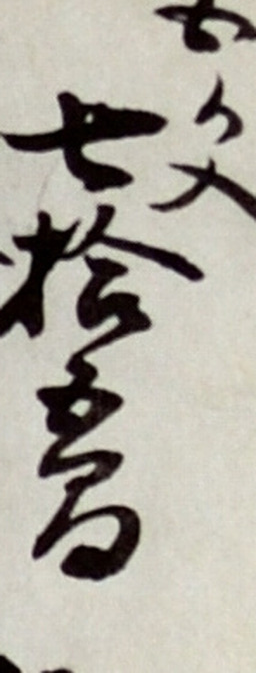弐拾五間
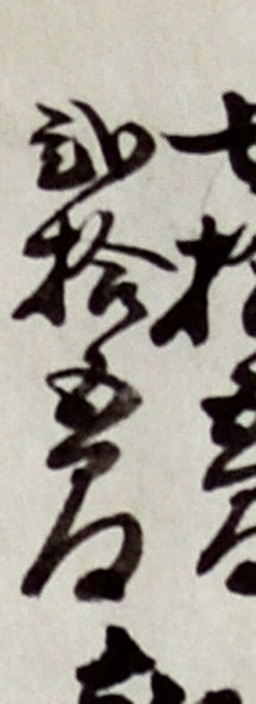弐拾五間
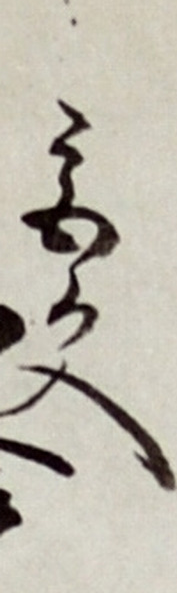宮ケ入
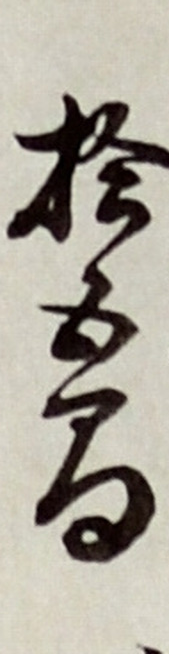拾五間
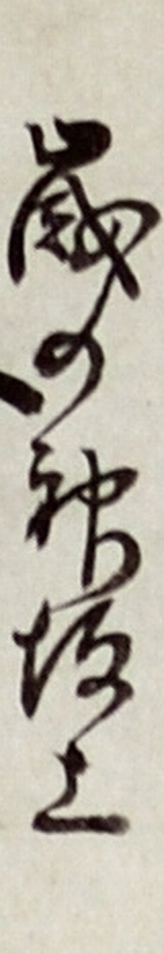歳の神坂上
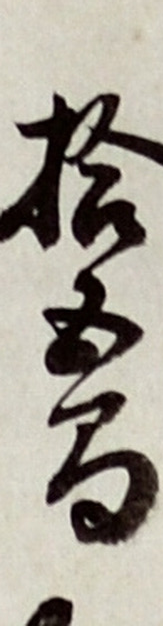拾五間
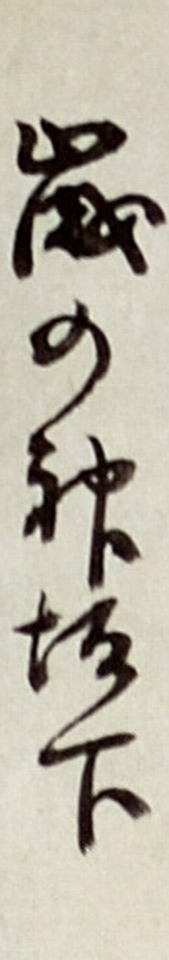歳の神坂下
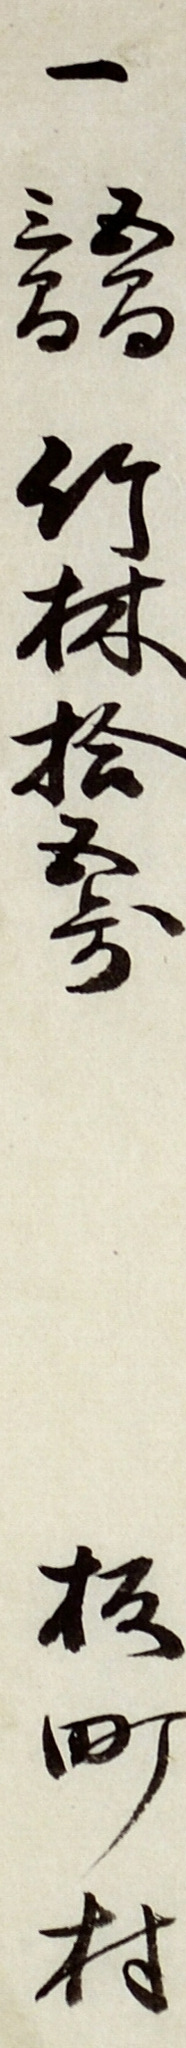一五間竹林拾五歩板町村
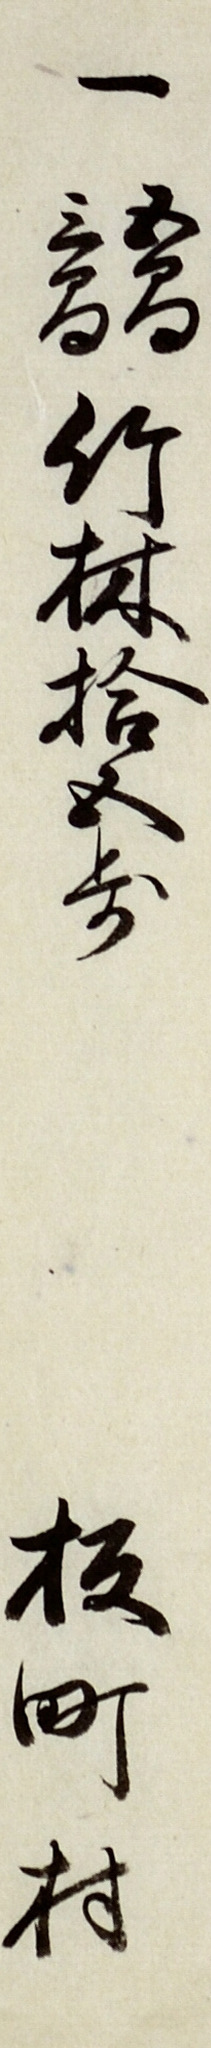一五間竹林拾五歩板町村
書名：御林御下ケ渡御請印帳
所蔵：伊那市立高遠町図書館・合同会社AMANE
